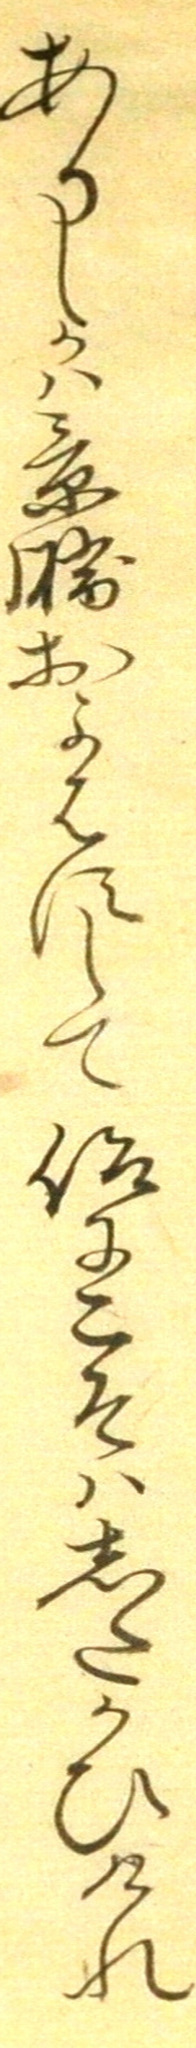ありしかは景勝およはすして仰にこそはしたかひけれ
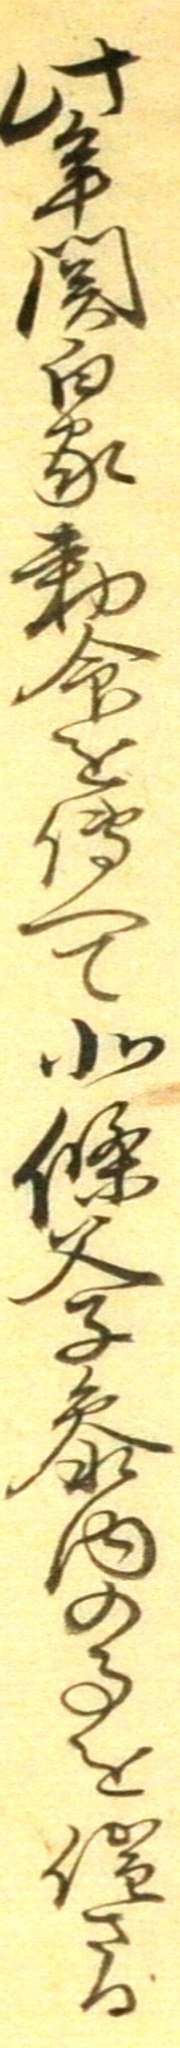此年関白家勅命を伝へて北条父子参内の事を催さる
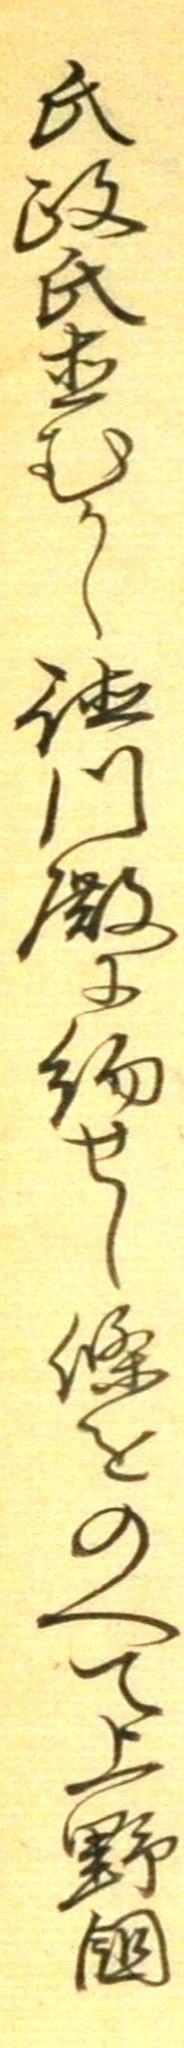氏政氏直むかし徳川殿に約せし条をのへて上野国
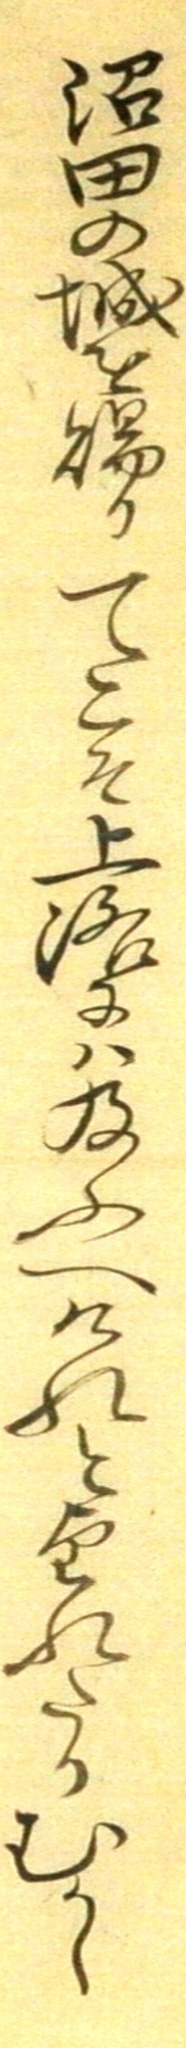沼田の城を賜りてこそ上洛には及ふへけれと望れたりむかし
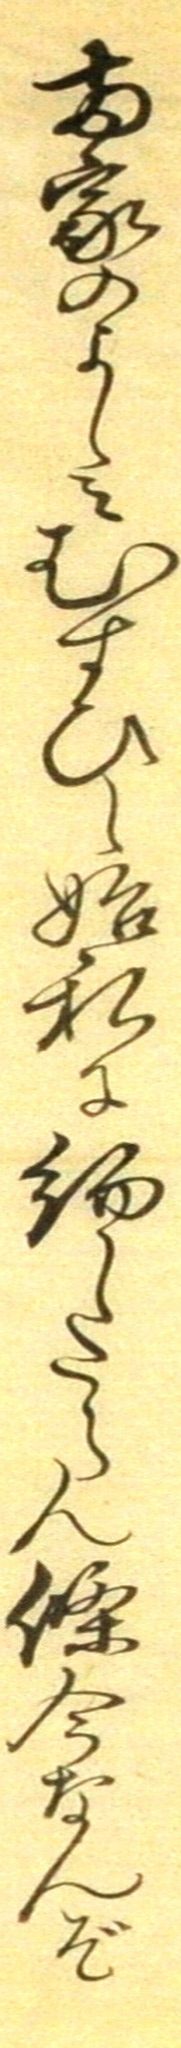両家のよしみむすひし始私に約したらん条今なんぞ
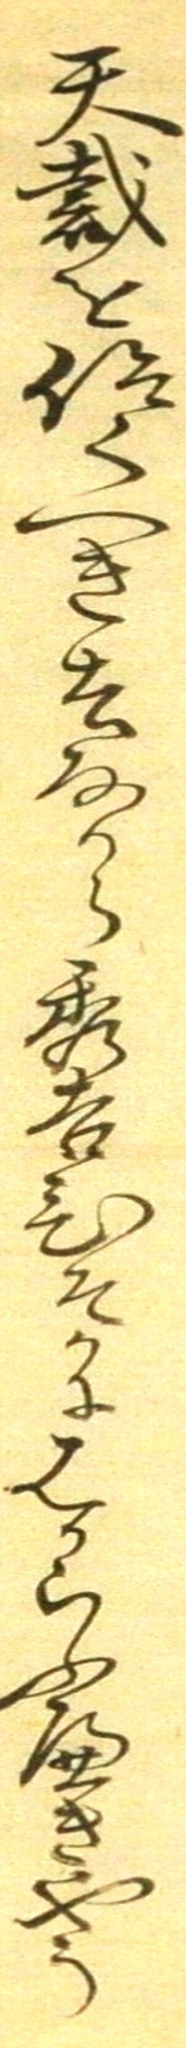天裁を仰くへき去なから秀吉ひそかにはからふへきやう
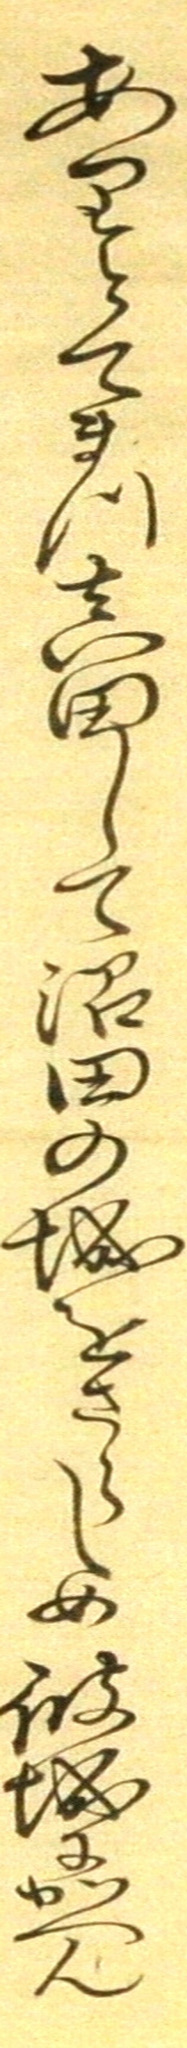ありとてまつ真田して沼田の城をさらしめ彼城にかへん
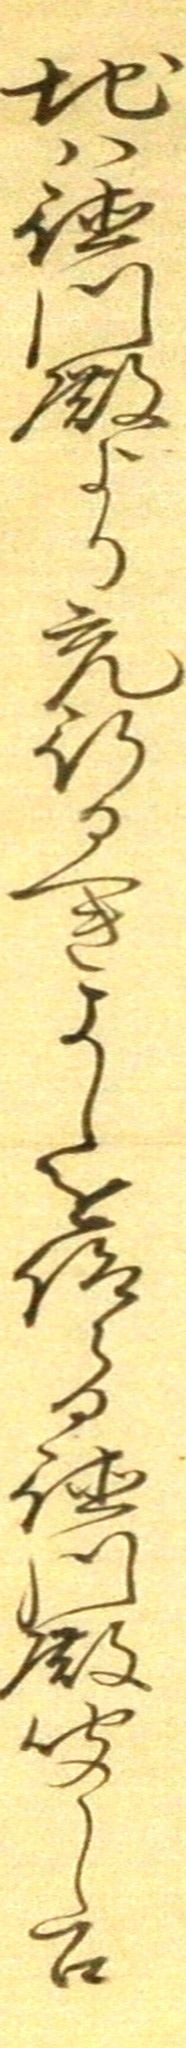地は徳川殿より充行るへきよしを仰らる徳川殿聞し召
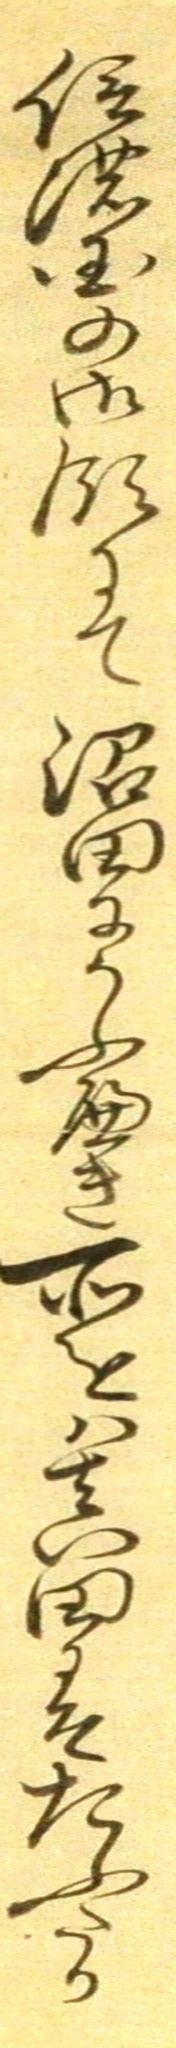信濃国の御領にて沼田にかふへき所をは真田にそたふたり
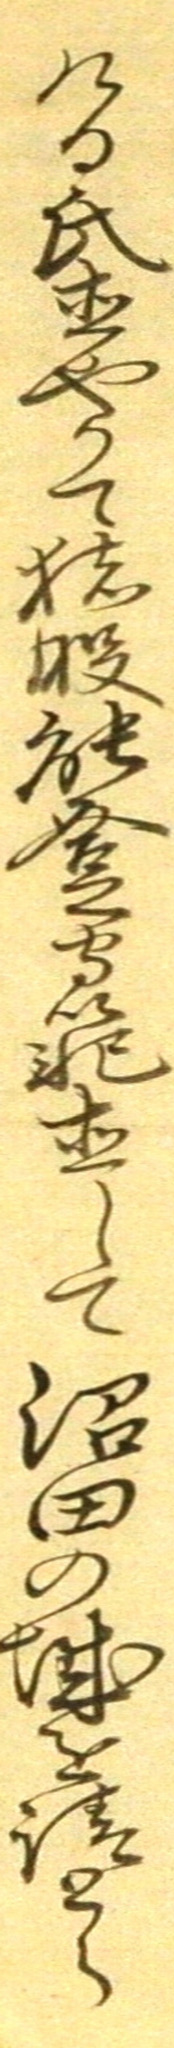ける氏直やかて猪股能登守範直して沼田の城を請とら
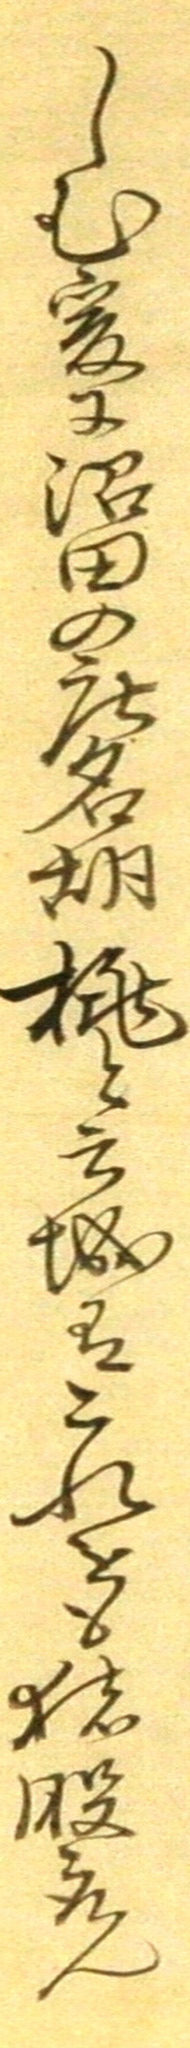しむ爰に沼田の庄名胡桃と云城有これをも猪股取ん
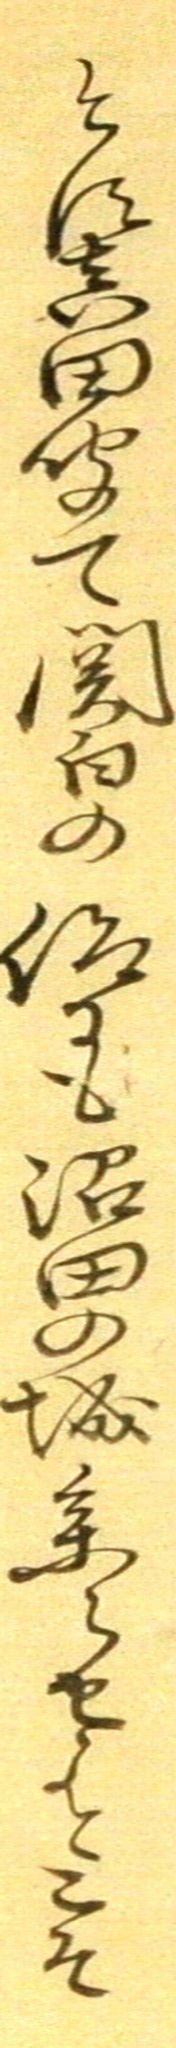とす真田聞て関白の仰にも沼田の城参らせよとこそ
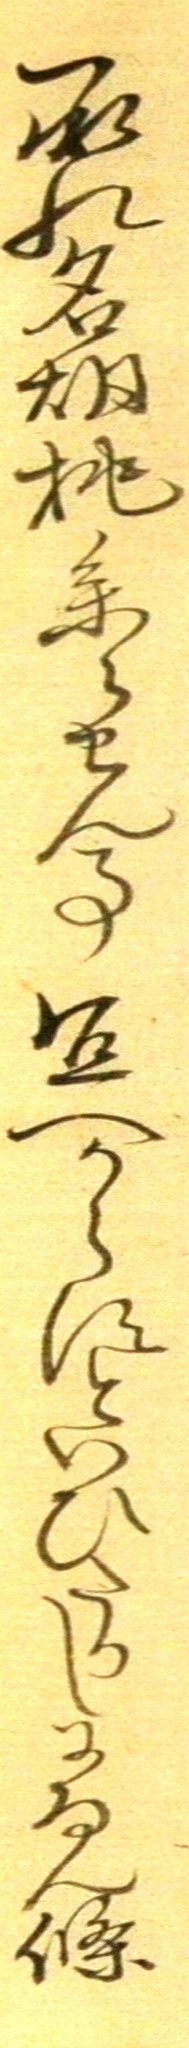承れ名胡桃参らせん事宣へからすといひたりしになん条

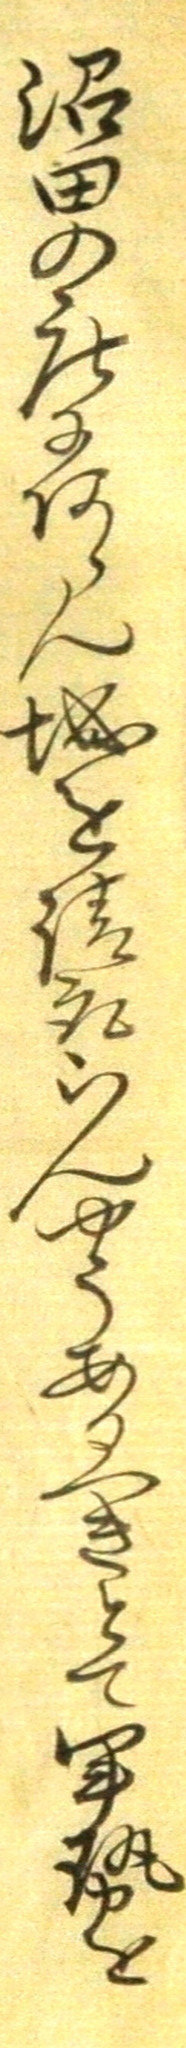沼田の庄にあらん城を請取らんやうあるへきとて軍勢を
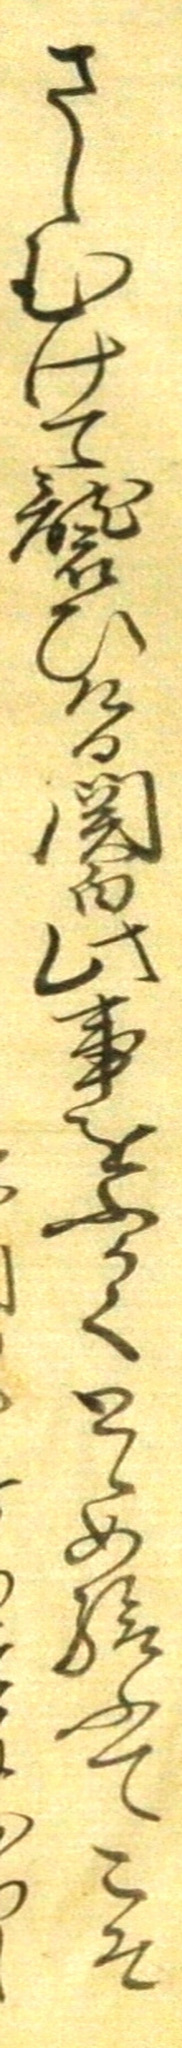さしむけて襲ひける関白此事をふかくとゝめ給ふてこそ
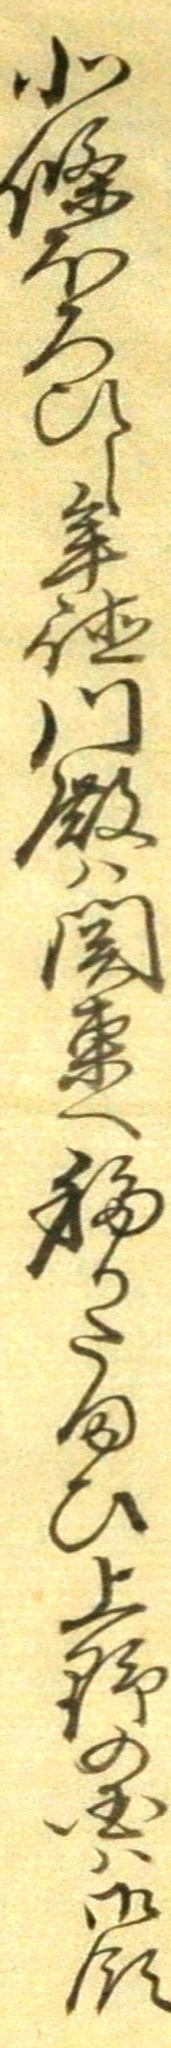北条ほろひし年徳川殿は関東へ移りたまひ上野の国は御領
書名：藩翰譜（九・上）
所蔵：伊那市立高遠町図書館・合同会社AMANE
